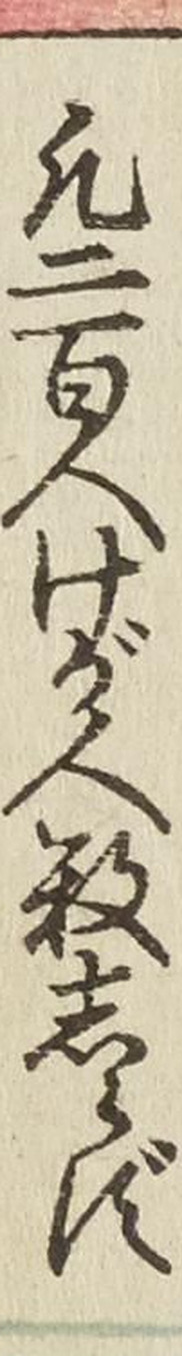凡二百人けが人数しらず
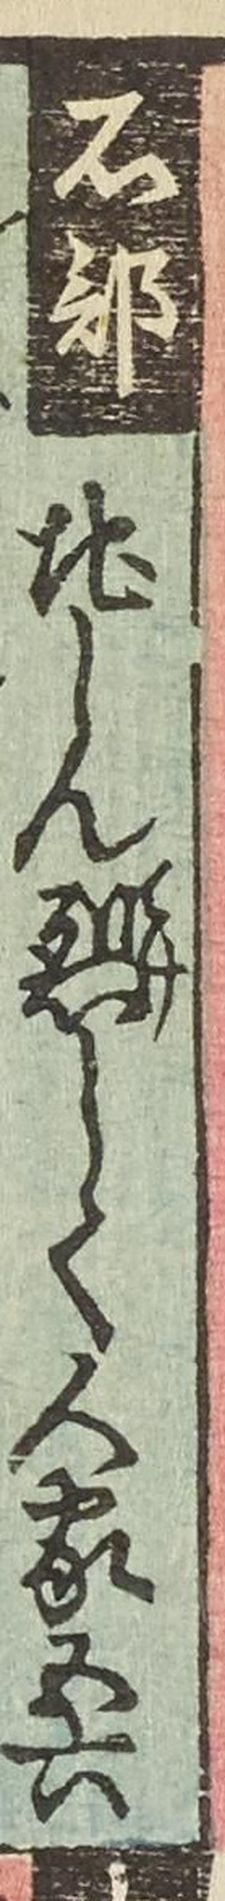石部地しん烈しく人家五六
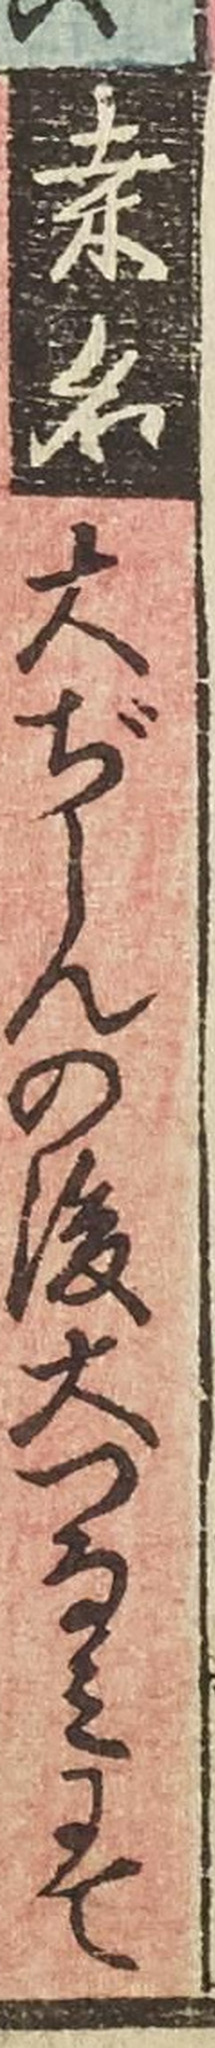桑名大ぢしんの後大つなみにて
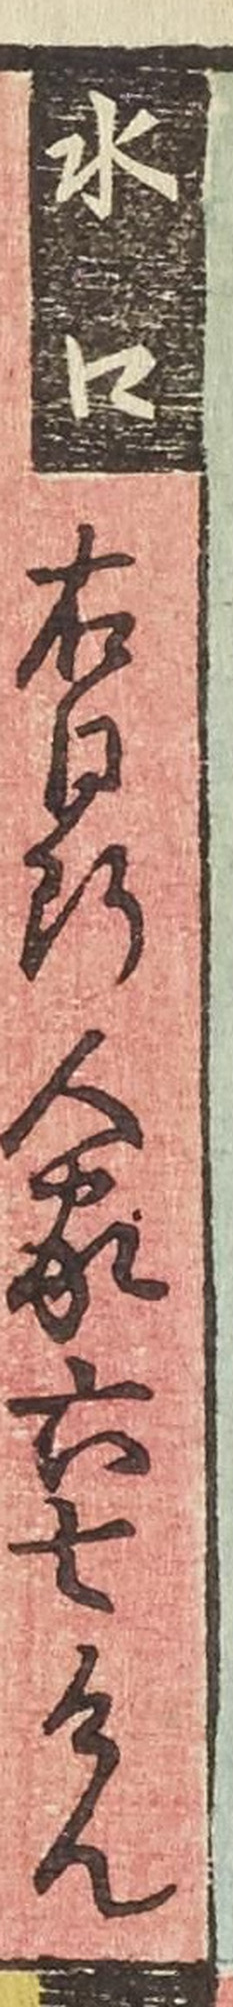水口右同断人家六七けん
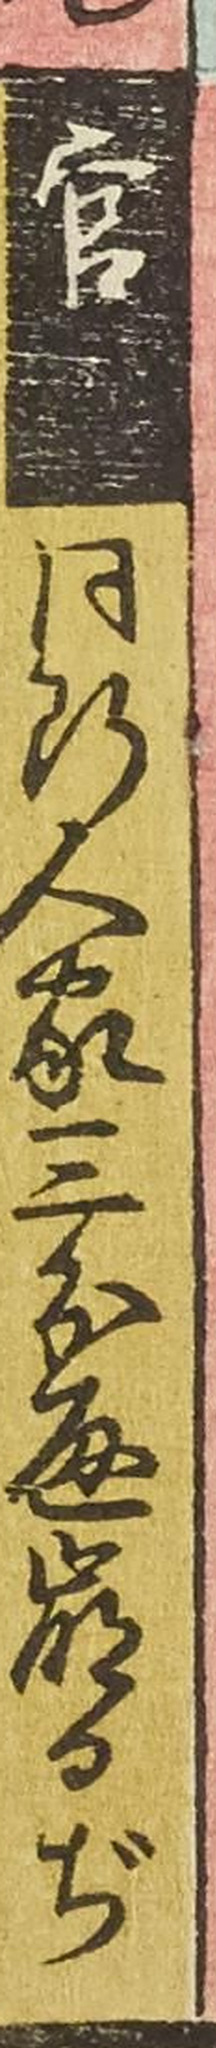宮同断人家三分通崩るぢ
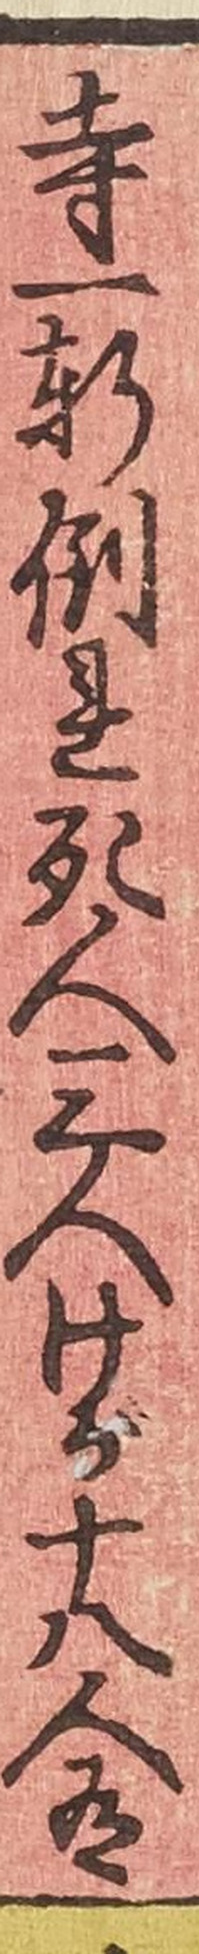寺一軒倒れ死人三人けが十八人有
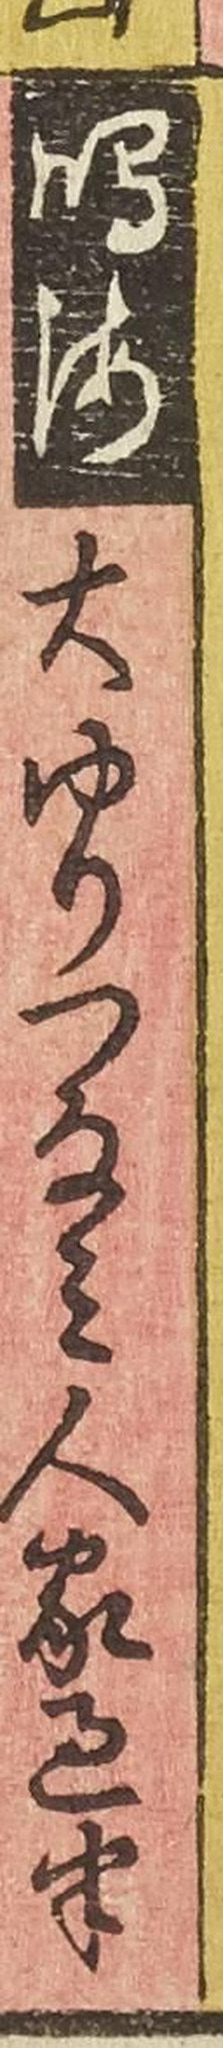鳴海大ゆりつなみ人家過半
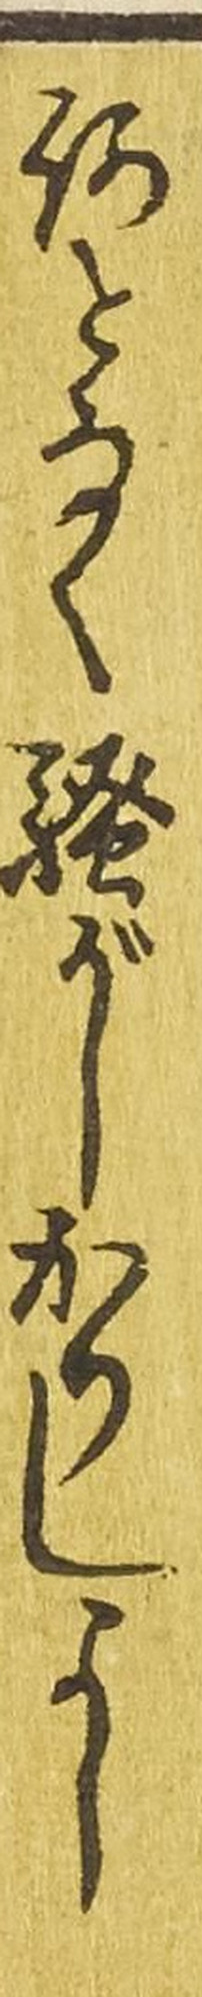何となく騒がしかりしよし
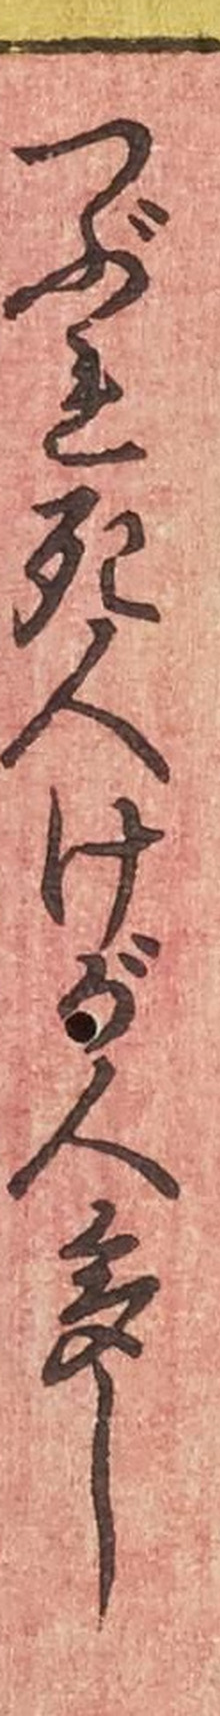つぶれ死人けが人多し
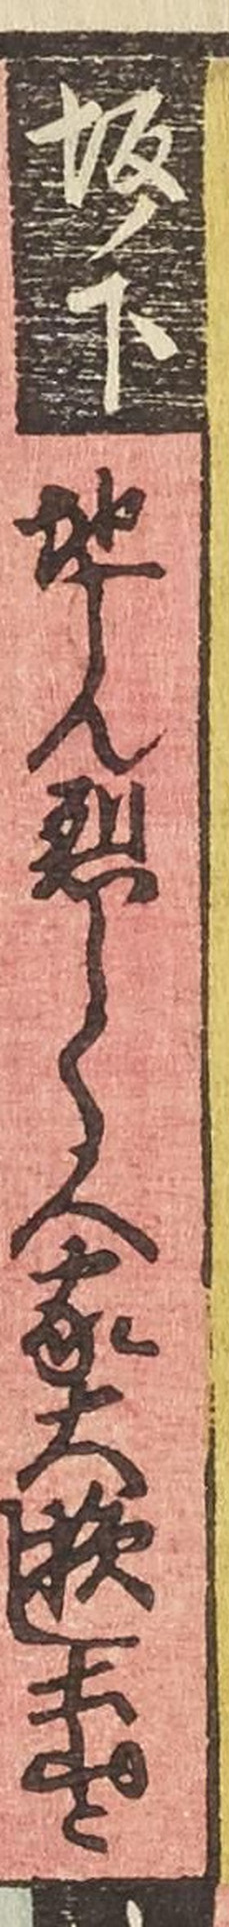坂ノ下地しん烈しく人家大損し土山と
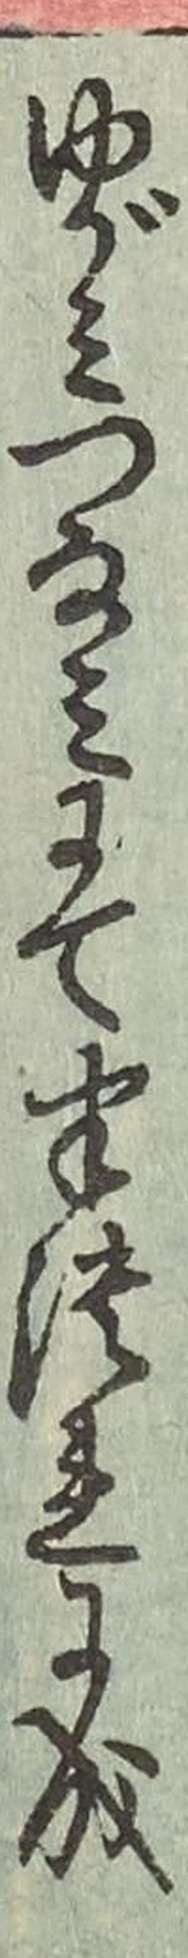ゆがみつなみにて半潰れに成
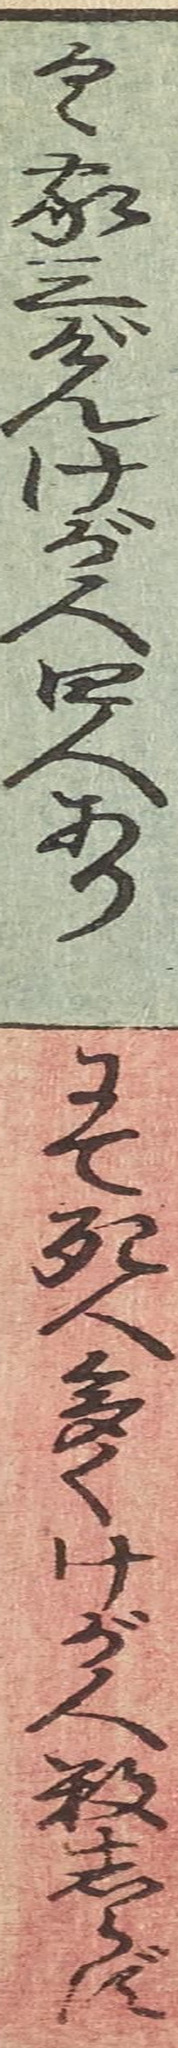るゝ家三げんけが人四人あり
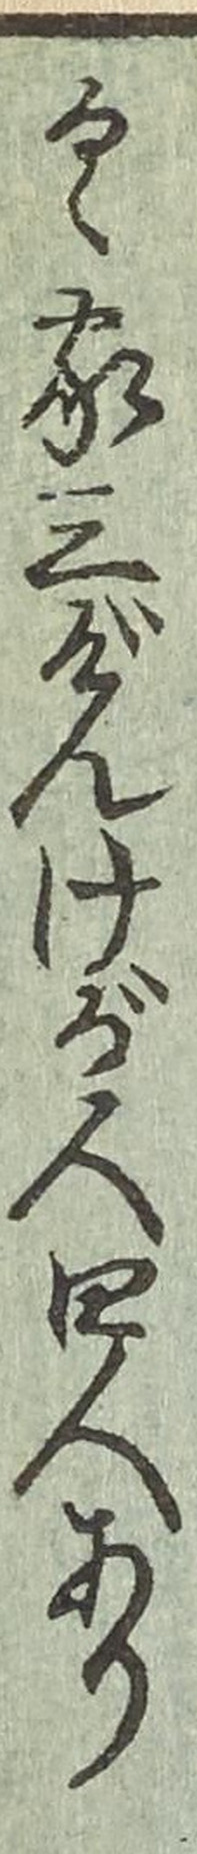るゝ家三げんけが人四人あり
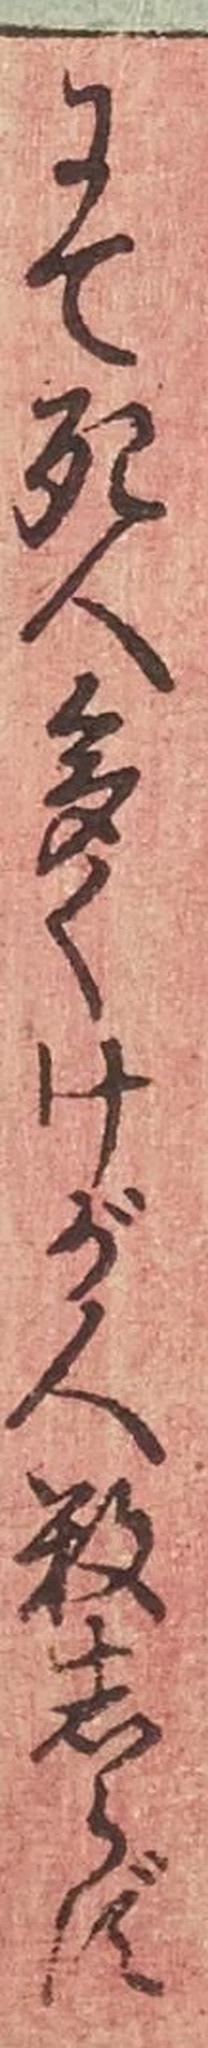にて死人多くけが人数しらず

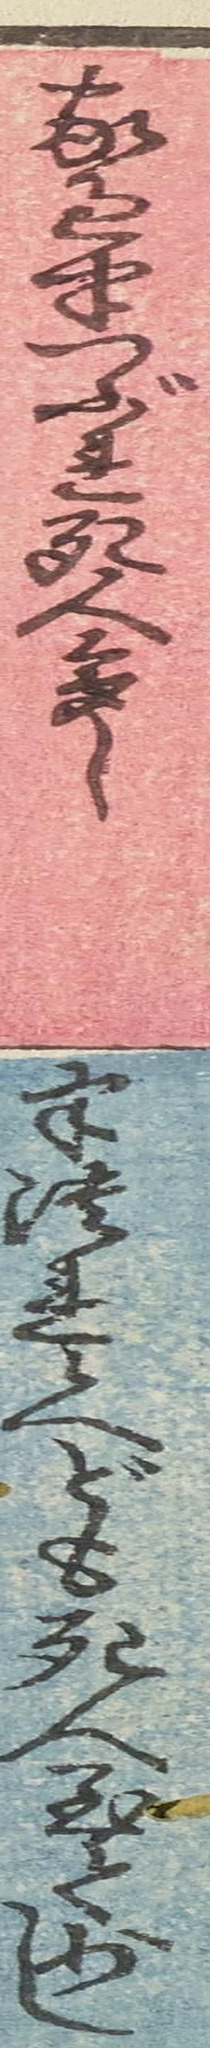家過半つぶれ死人多し
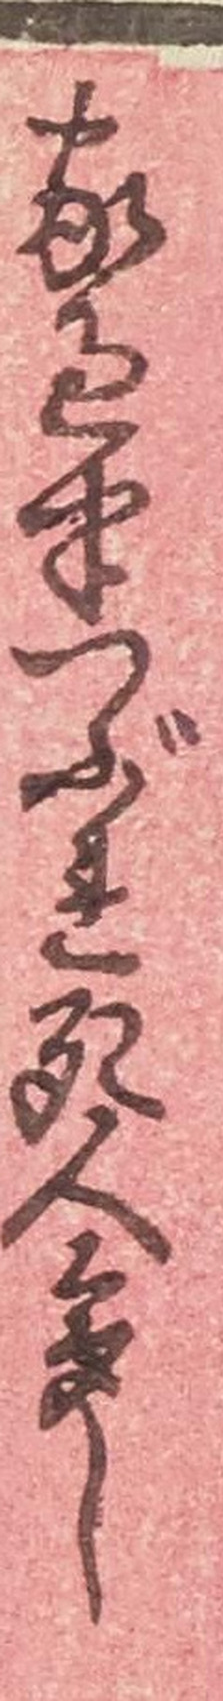家過半つぶれ死人多し
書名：大地震大津浪末代噺種　（二編　全）
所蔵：東京大学地震研究所図書室 Earthquake Research Institute Library, The University of Tokyo, JAPAN
